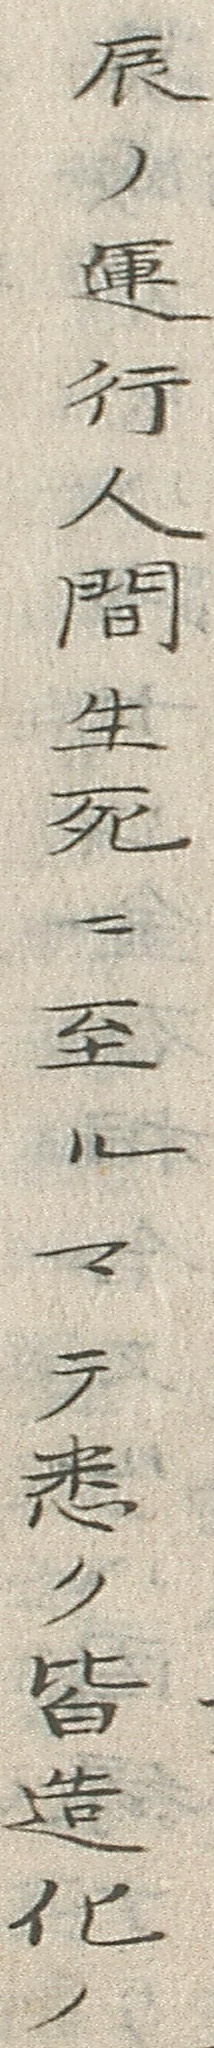辰ノ運行人間生死ニ至ルマテ悉ク皆造化ノ
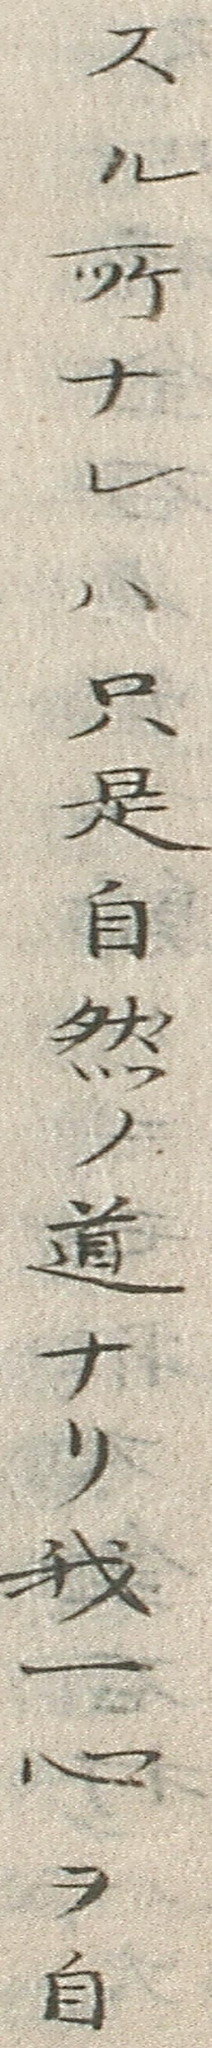スル所ナレハ只是自然ノ道ナリ我一心ヲ自
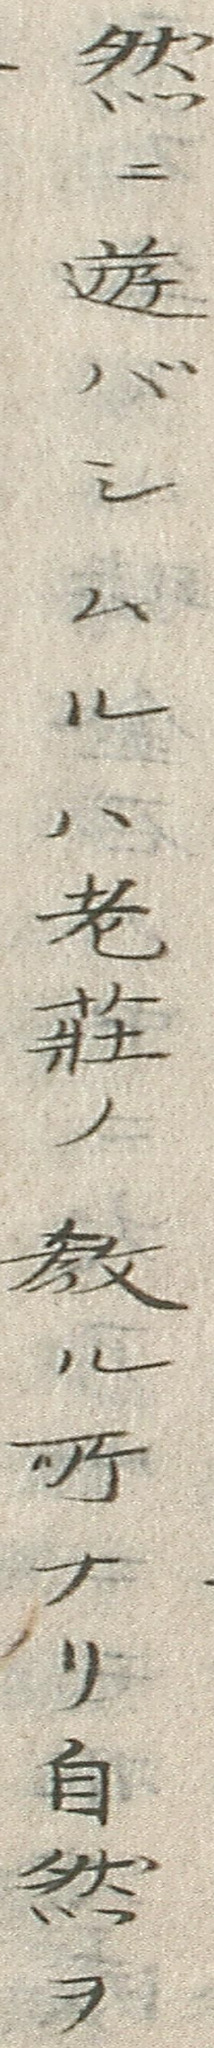然ニ遊バシムルハ老荘ノ教ル所ナリ自然ヲ
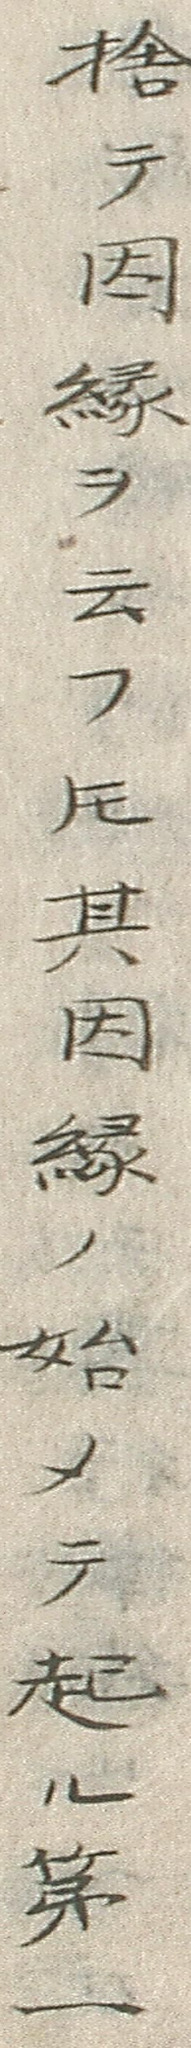捨テ因縁ヲ云フトモ其因縁ノ始メテ起ル第一
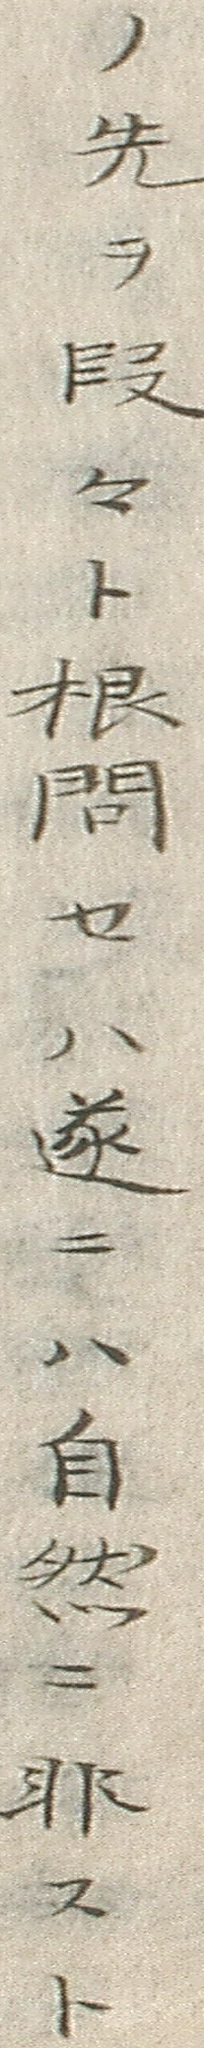ノ先ヲ叚々ト根問セハ遂ニハ自然ニ非スト
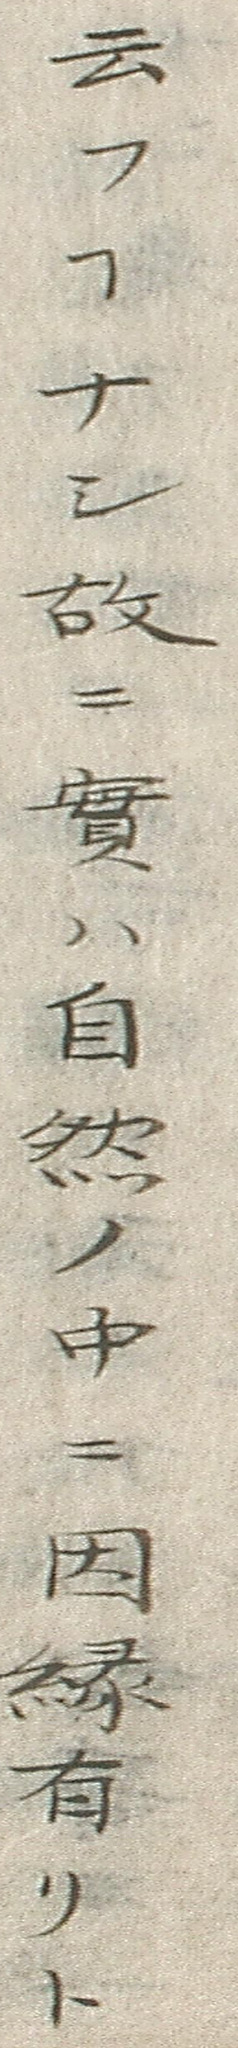云フコトナシ故ニ実ハ自然ノ中ニ因縁有リト
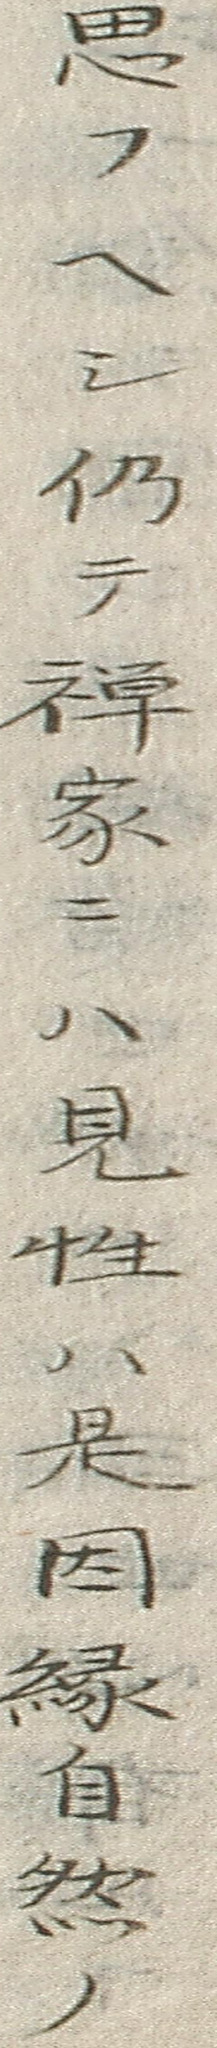思フヘシ仍テ禅家ニハ見性ハ是因縁自然ノ
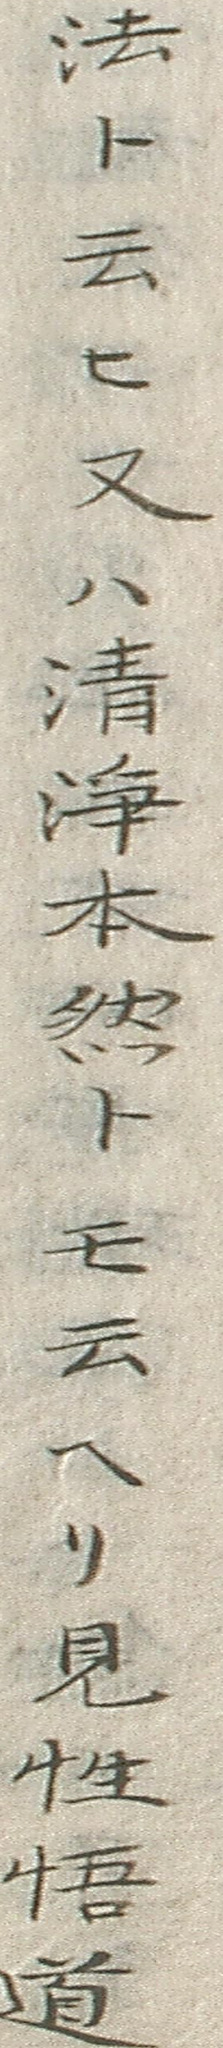法ト云ヒ又ハ清浄本然トモ云ヘリ見性悟道
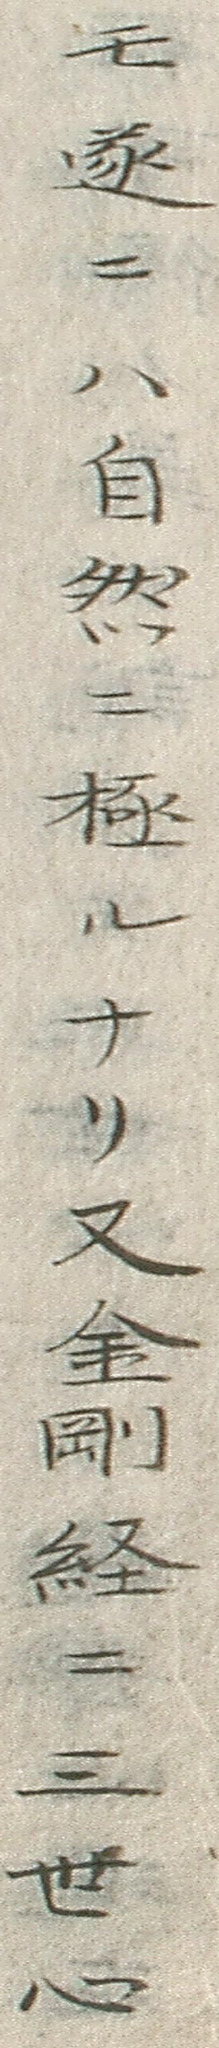モ遂ニハ自然ニ極ルナリ又金剛経ニ三世心

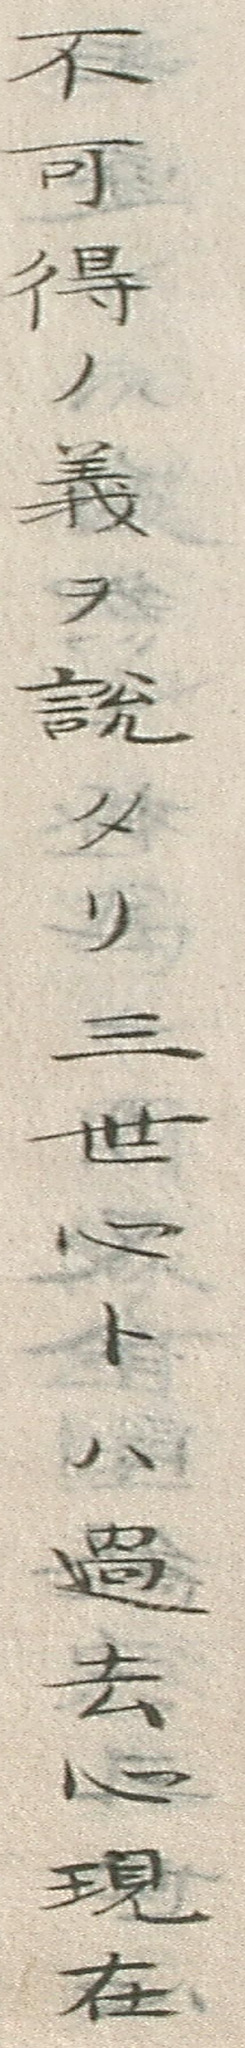不可得ノ義ヲ説タリ三世心トハ過去心現在
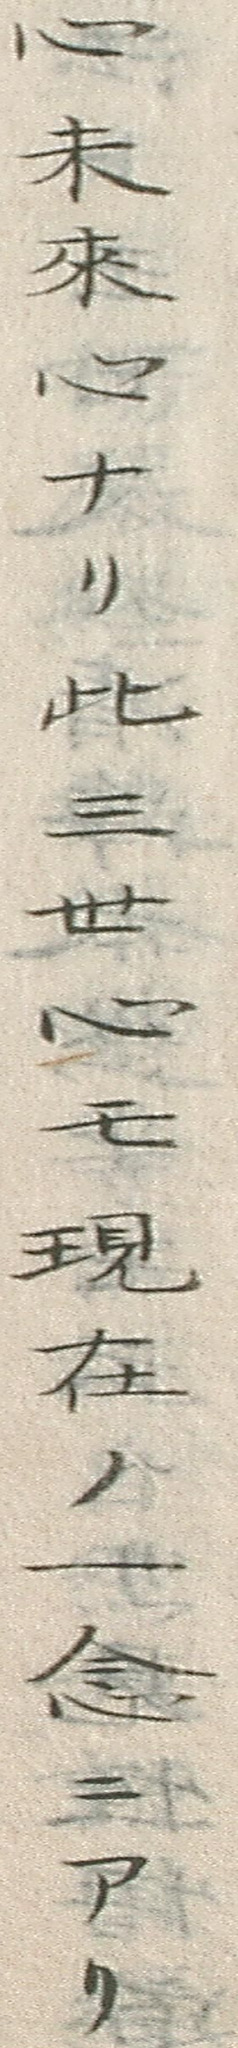心未来心ナリ此三世心モ現在ノ一念ニアリ
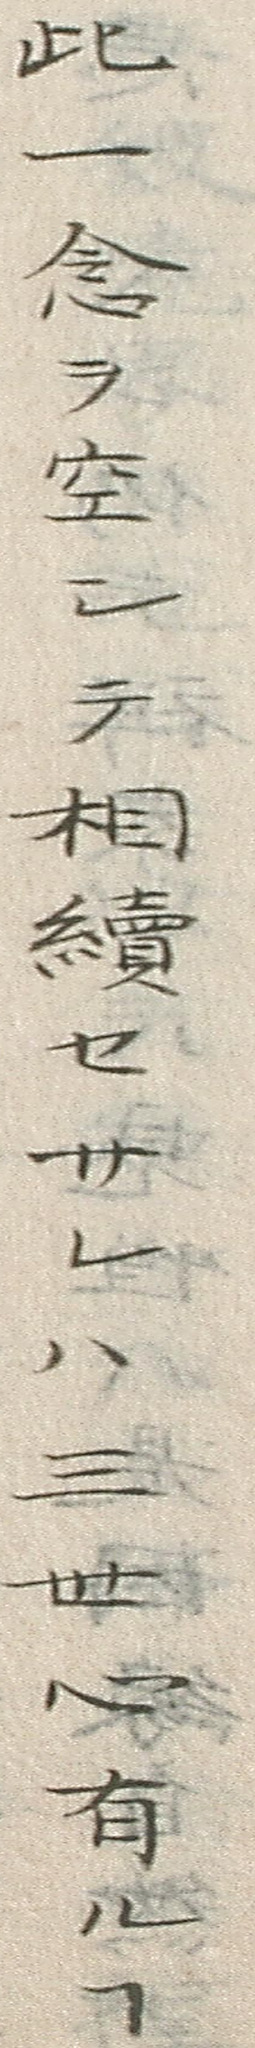此一念ヲ空シテ相続セサレハ三世心有ルコト
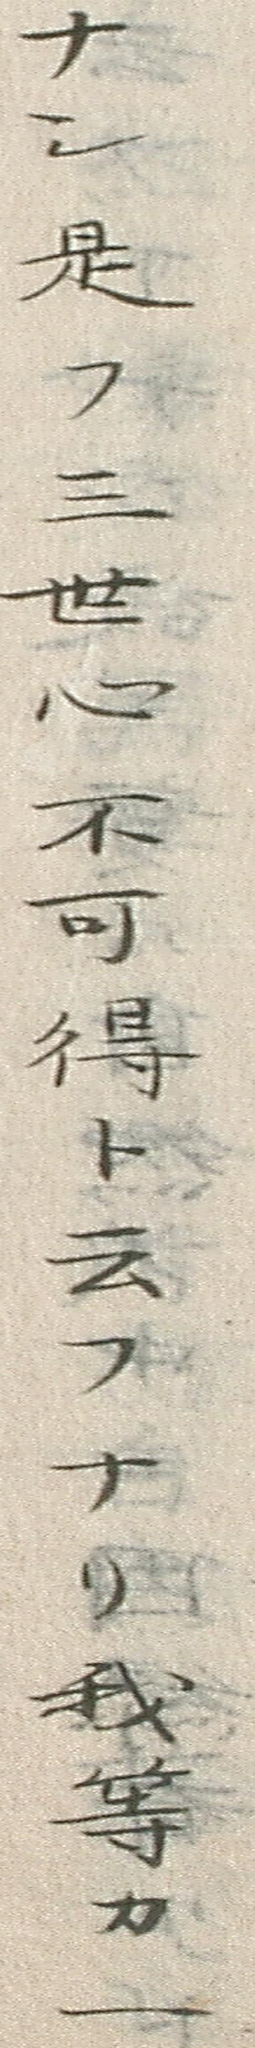ナシ是フ三世心不可得ト云フナリ我等カ一
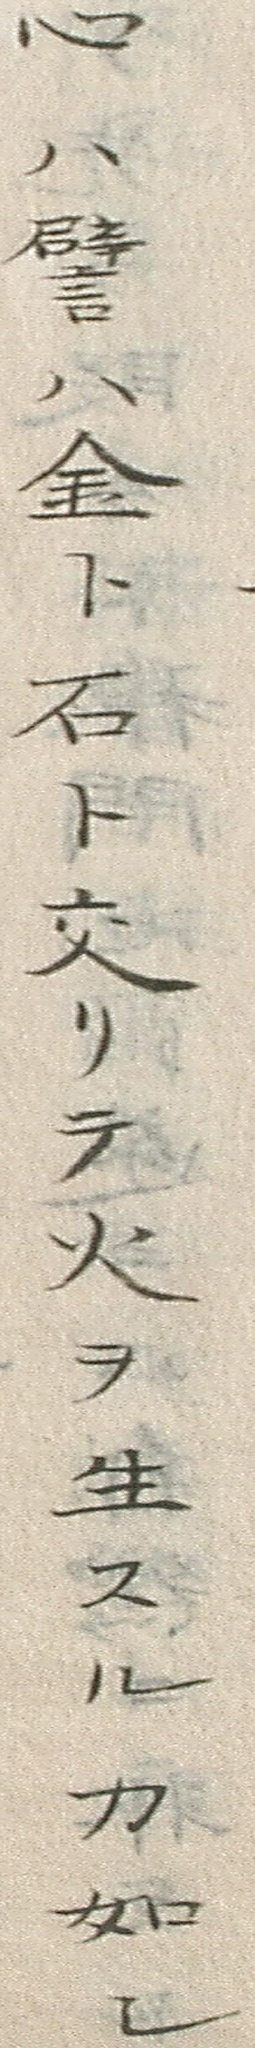心ハ譬ハ金ト石ト交リテ火ヲ生スルカ如シ
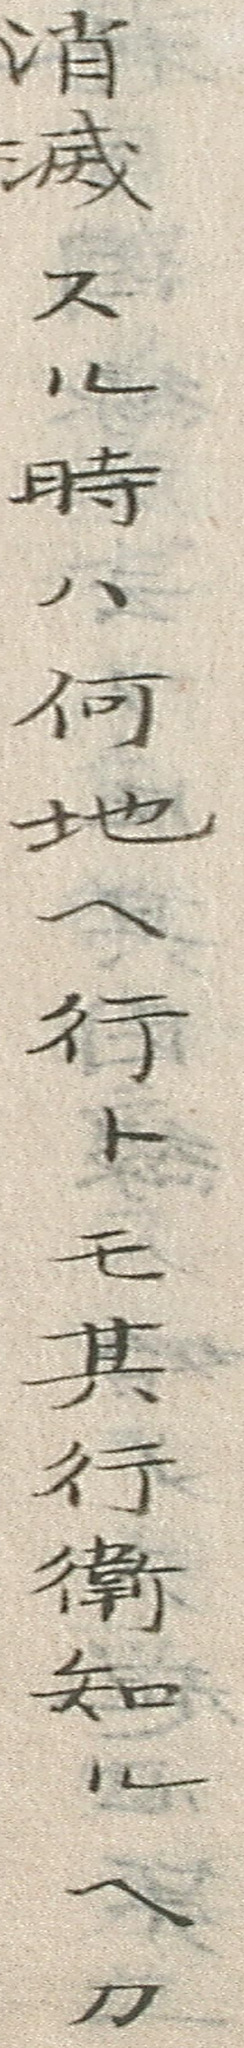消滅スル時ハ何地ヘ行トモ其行衛知ルヘカ
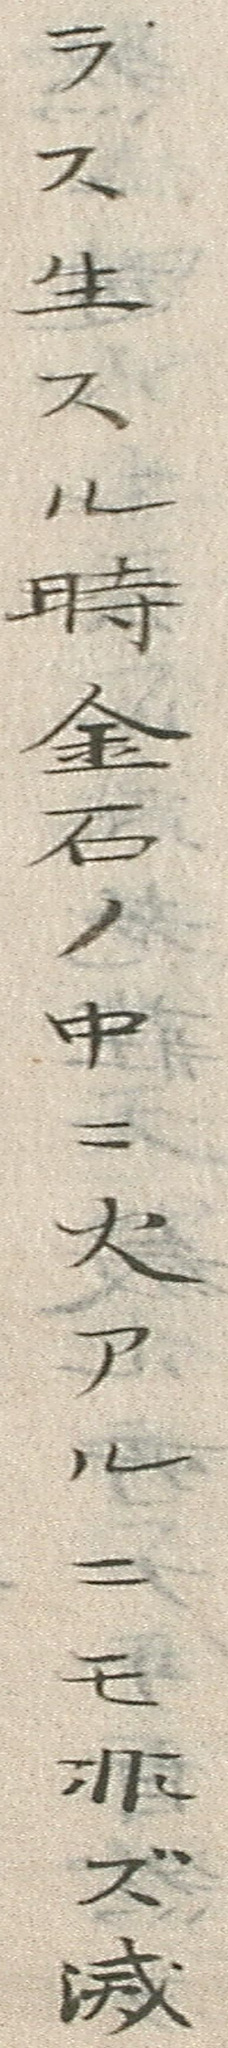ラス生スル時金石ノ中ニ火アルニモ非ズ滅
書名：天學略名目羽翼　全
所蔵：東京大学地震研究所図書室 Earthquake Research Institute Library, The University of Tokyo, JAPAN
